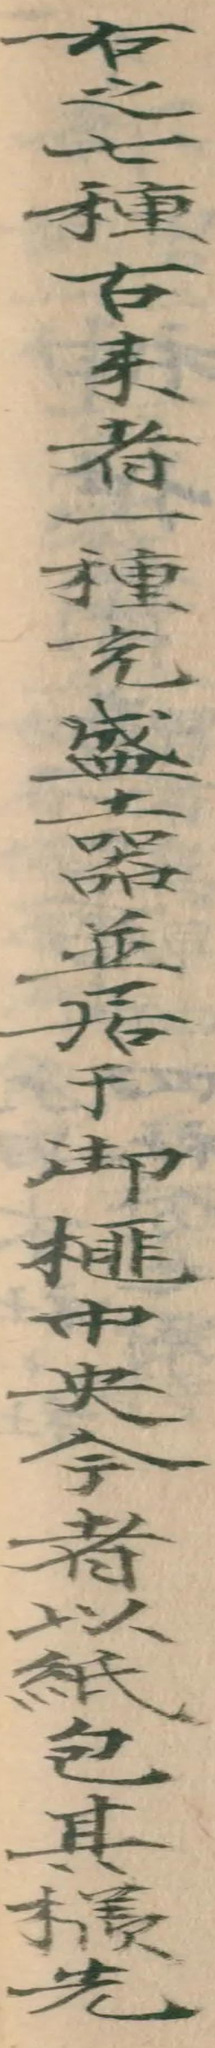右之七種古来者一種充盛土器並居于御榧中央今者以紙包其様先
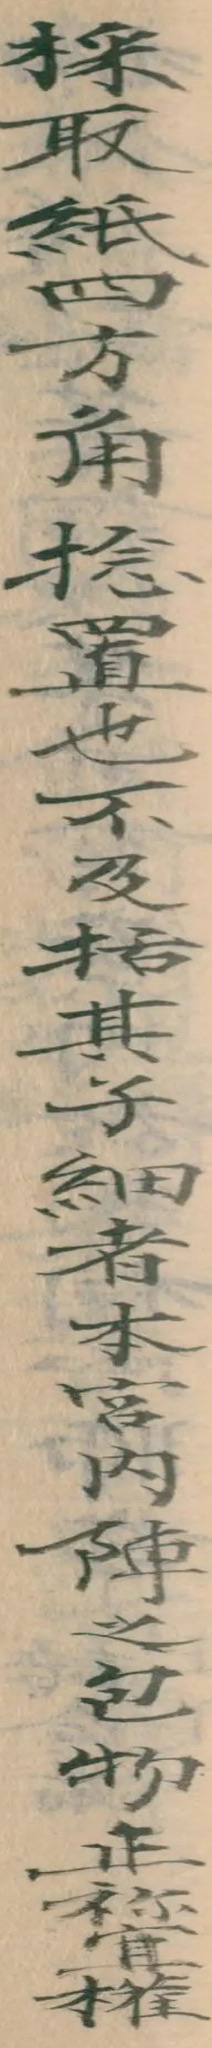採取紙四方角捻置也不及括其子細者本宮内陣之包物正祢宜権
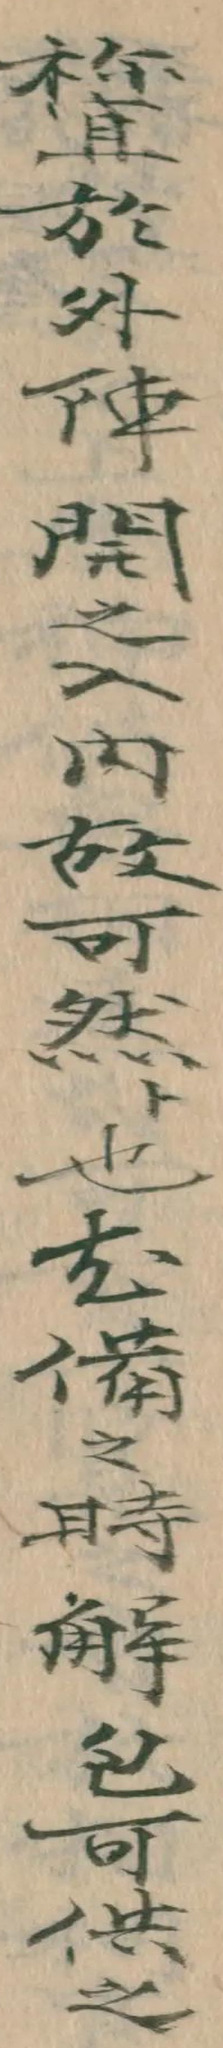祢宜於外陣開之入内故可然ト也尤備之時解包可供之
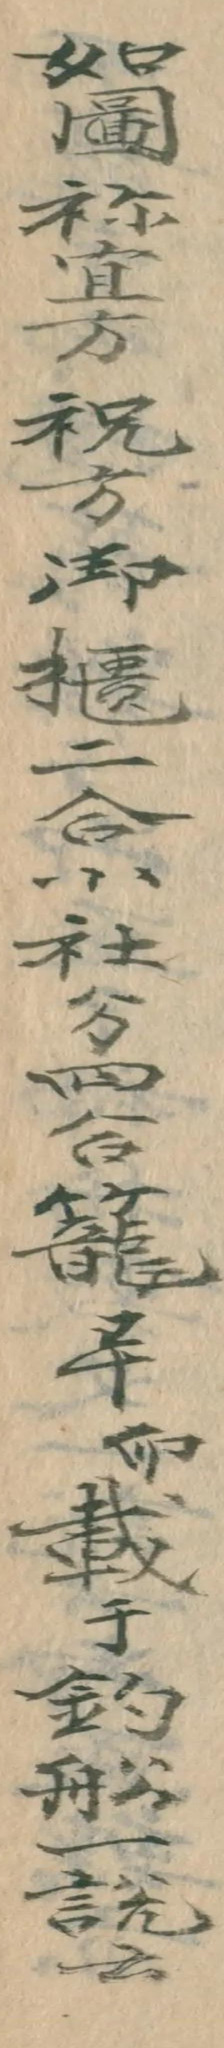如図祢宜方祝方御櫃二合小社分四合籠畢而載于釣船一説云

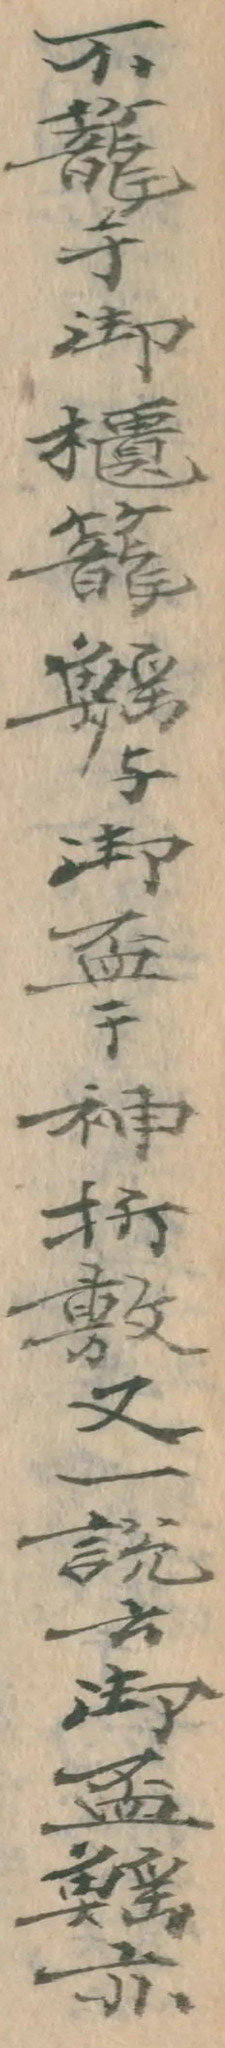不籠于御櫃籠鰩与御盃于神折敷又一説云御盃鰩亦
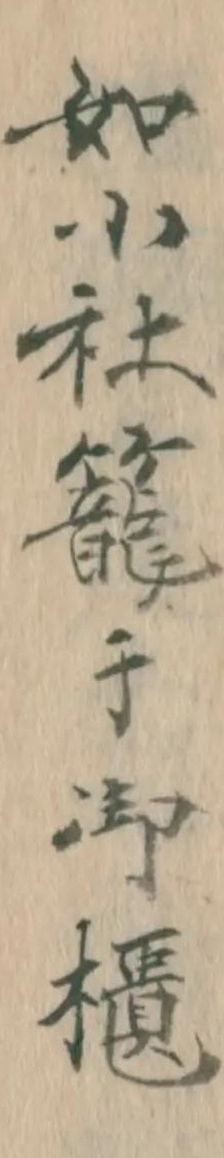如小社籠于御櫃
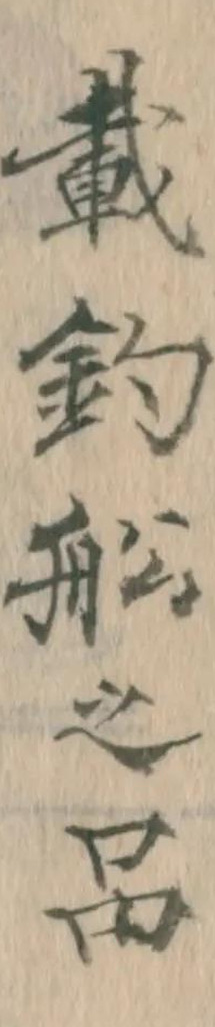載釣船之品
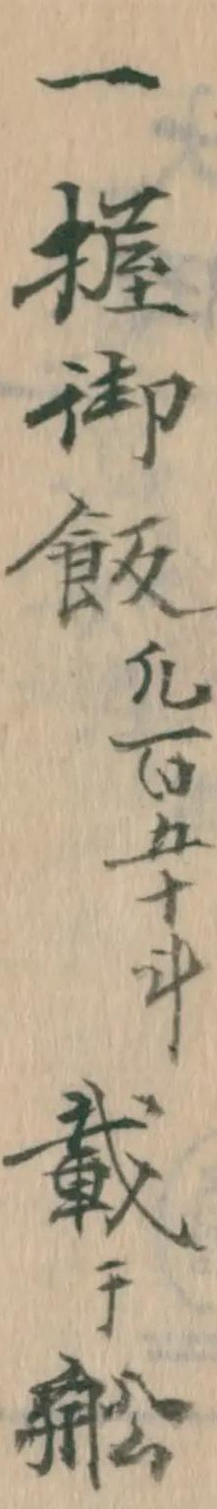一握御飯凡百五十計載于船
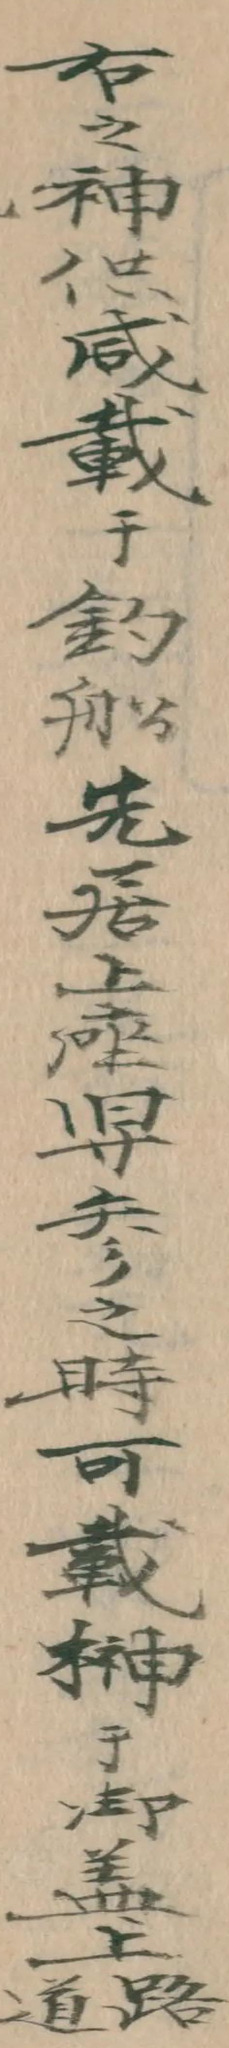右之神供咸載于釣船先居上座舁参之時可載榊于御盖上路道
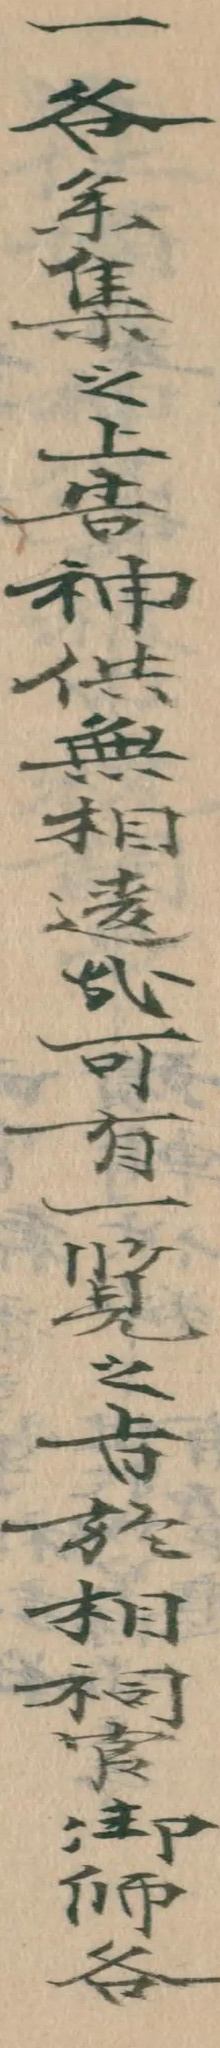一各参集之上告神供無相違哉可有一覧之旨於相祠官御師各

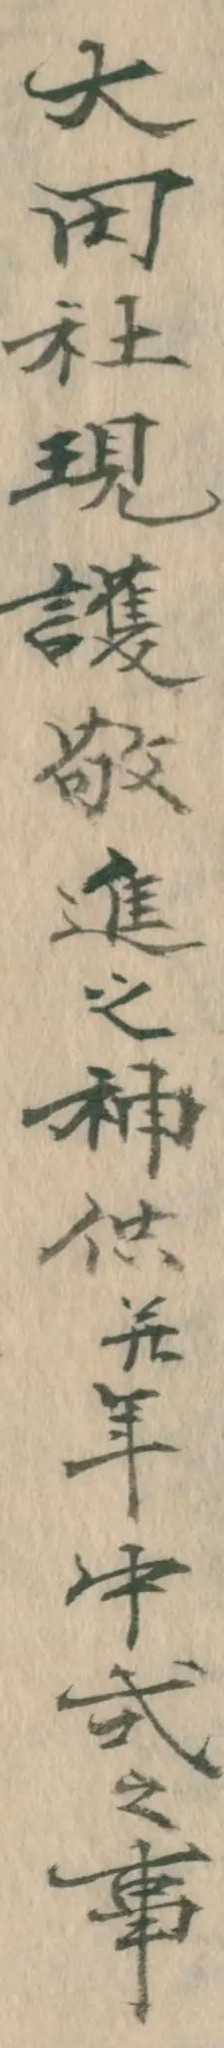大田社現護敬進之神供并年中式之事
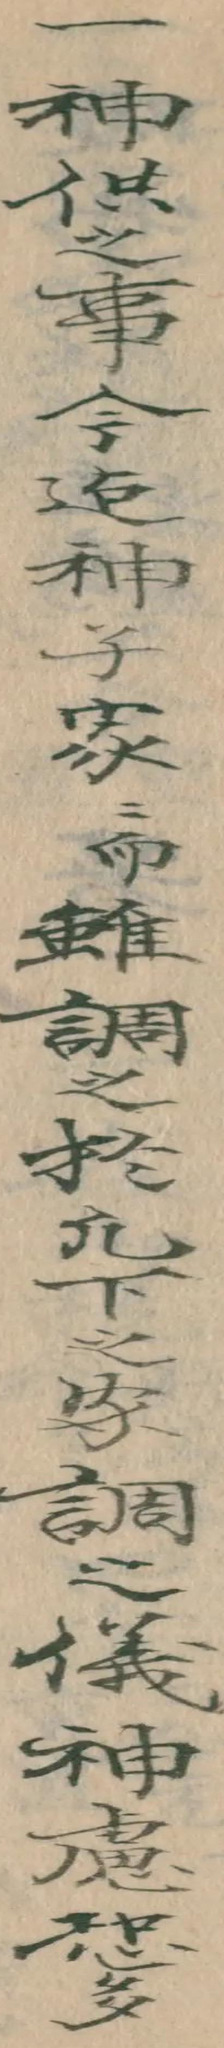一神供之事今迄神子家ニ而雖調之於凡下之家調之儀神慮恐多
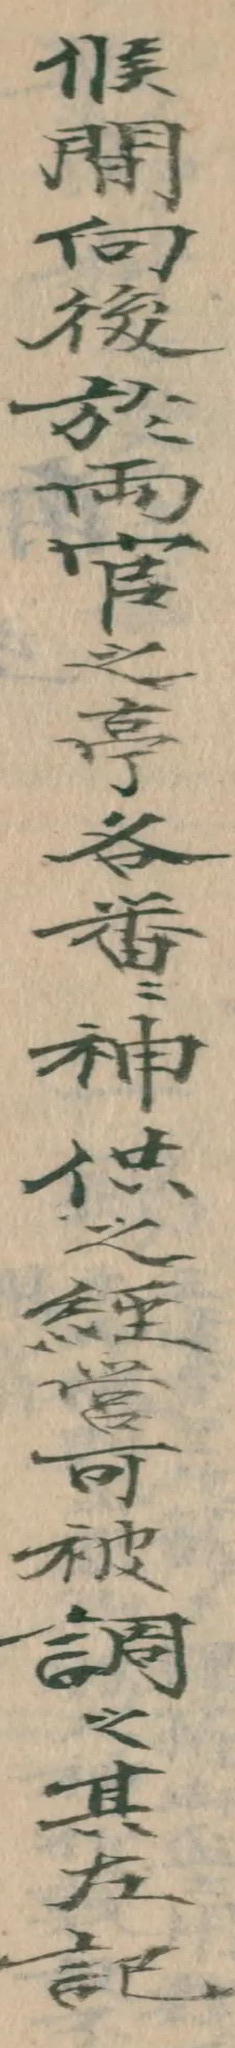候間向後於両官之亭各番ニ神供之経営可被調之其左記
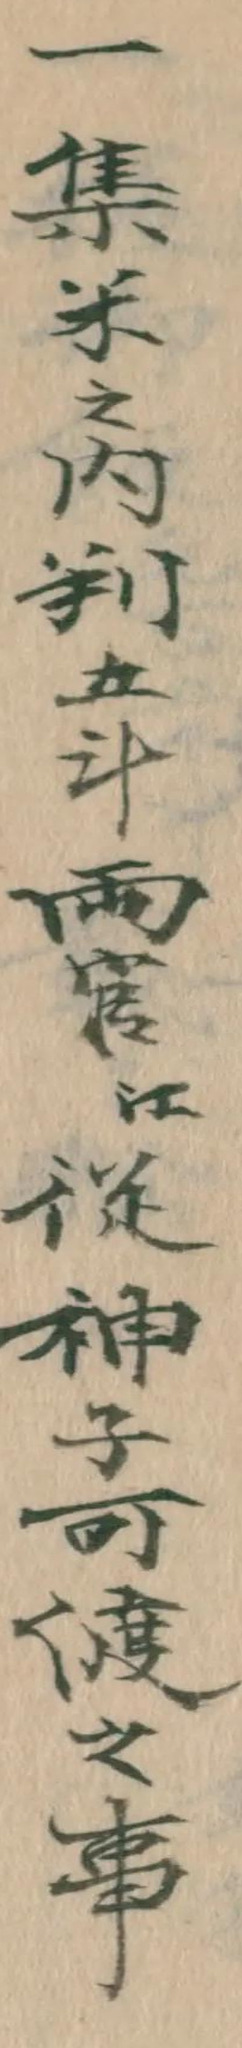一集米之内判五斗両官江従神子可渡之事
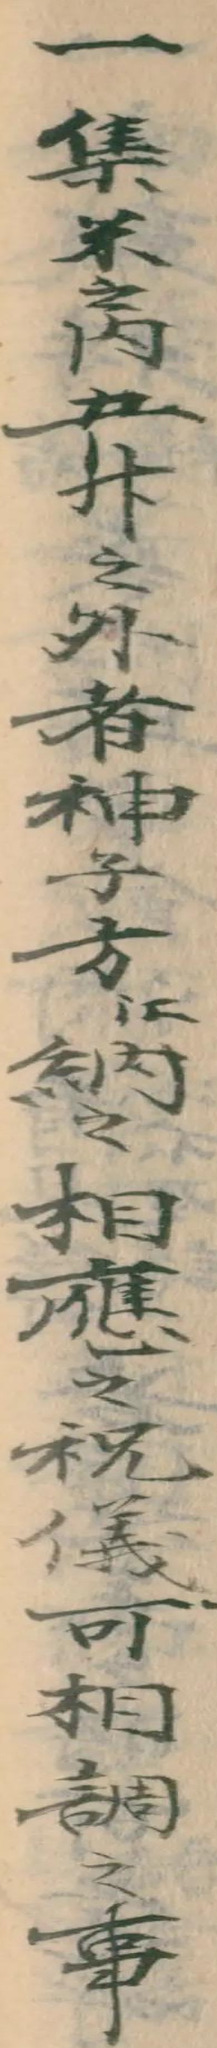一集米之内五升之外者神子方江納之相応之祝儀可相調之事
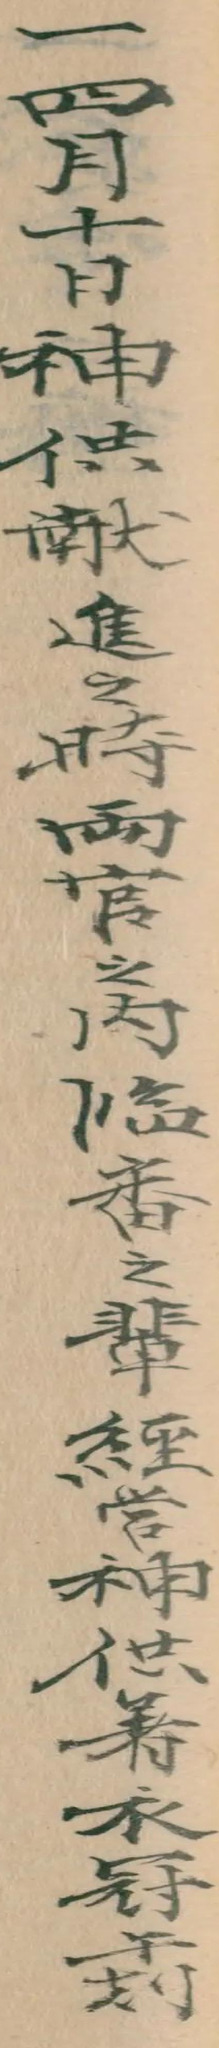一四月十日神供献進之時両官之内臨番之輩経営神供着衣冠午刻
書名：賀茂社記録. 第9冊
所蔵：国立国会図書館 National Diet Library, JAPAN
